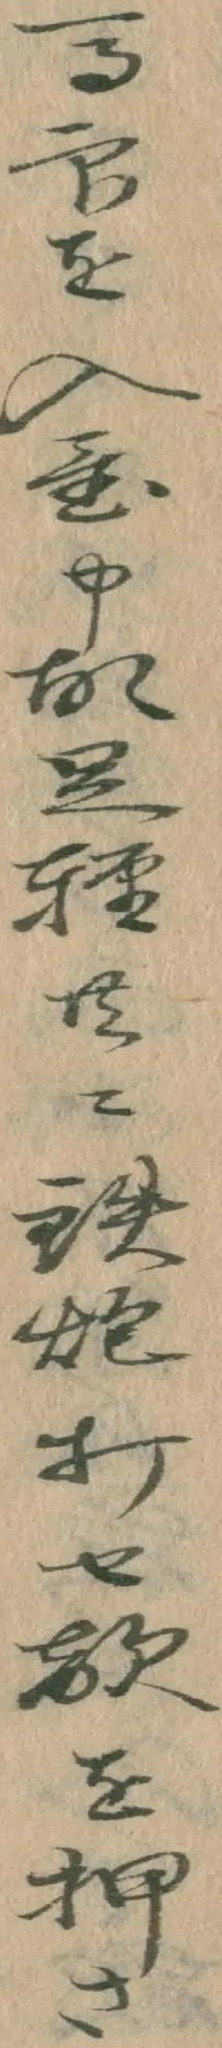馬印を入置申故足軽共に鉄炮打せ敵を押さ
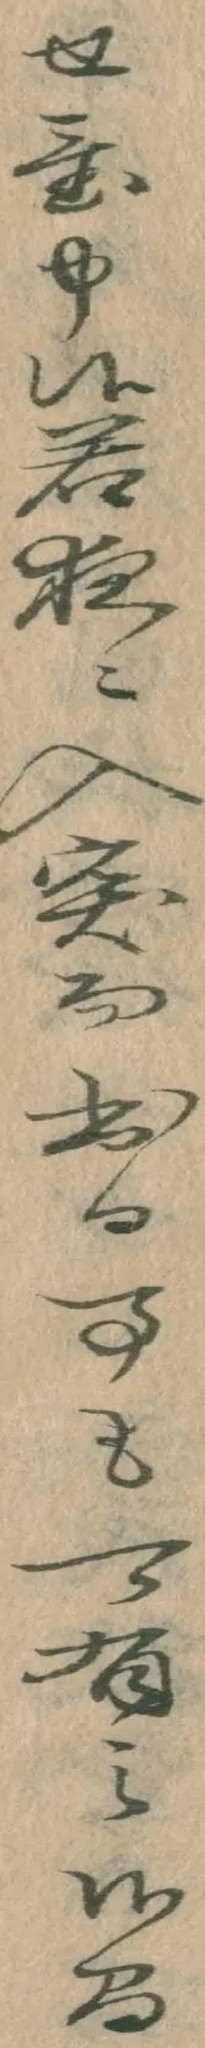せ置申候若夜に入突而出る事も可有之候間
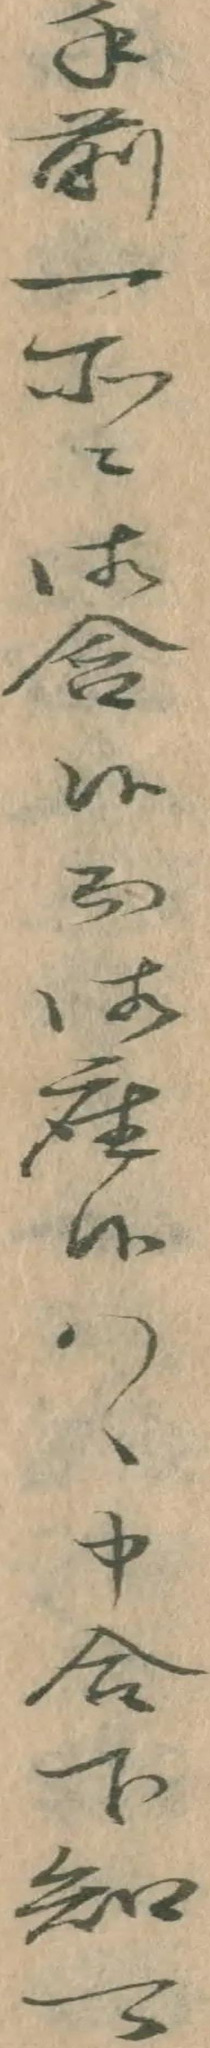手前一所に御含候而御座候はゝ申合下知可

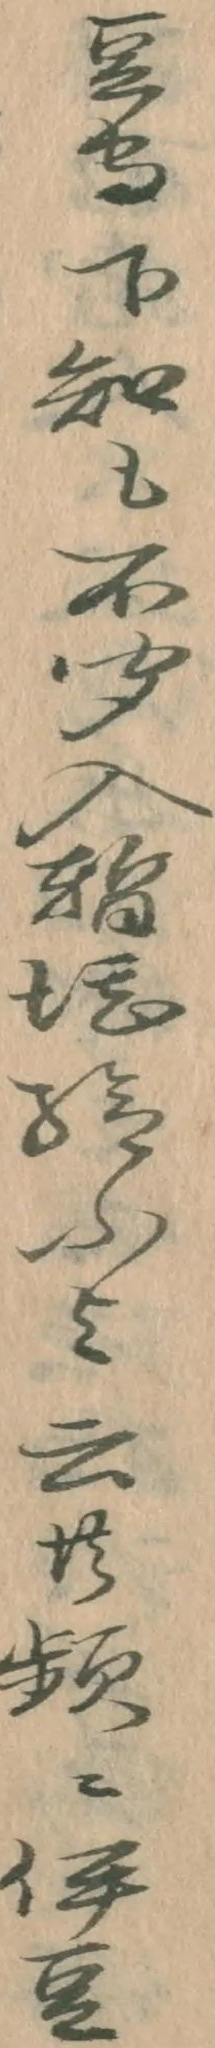豆守下知も不聞入暫堪給ふ与云共頻に伊豆
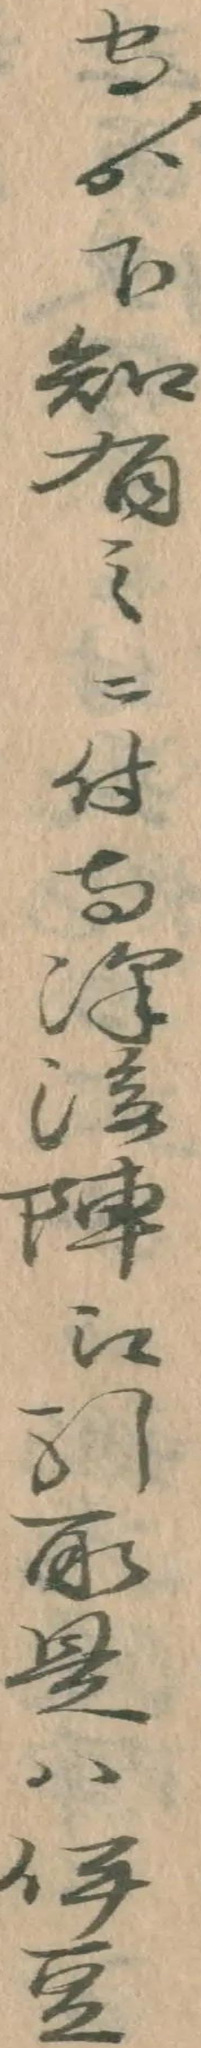守ゟ下知有之に付寺沢後陣江引取是は伊豆
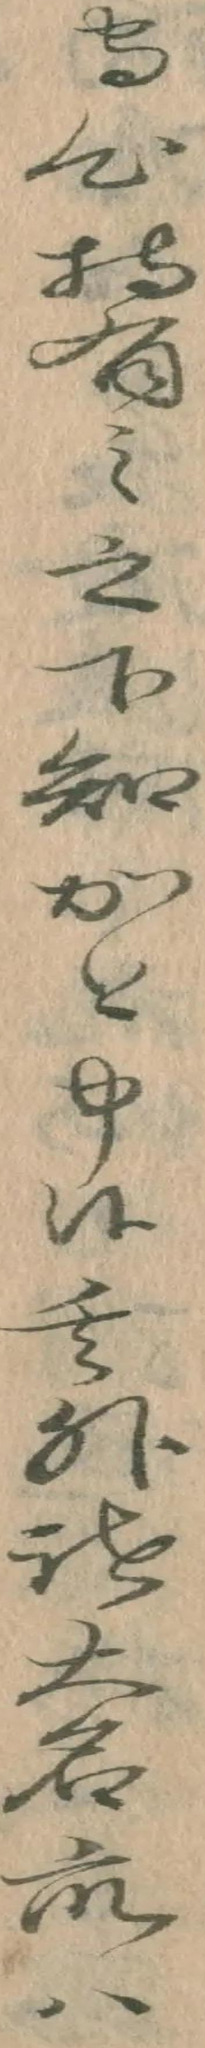守心持有之令下知かと申候其外諸大名衆は
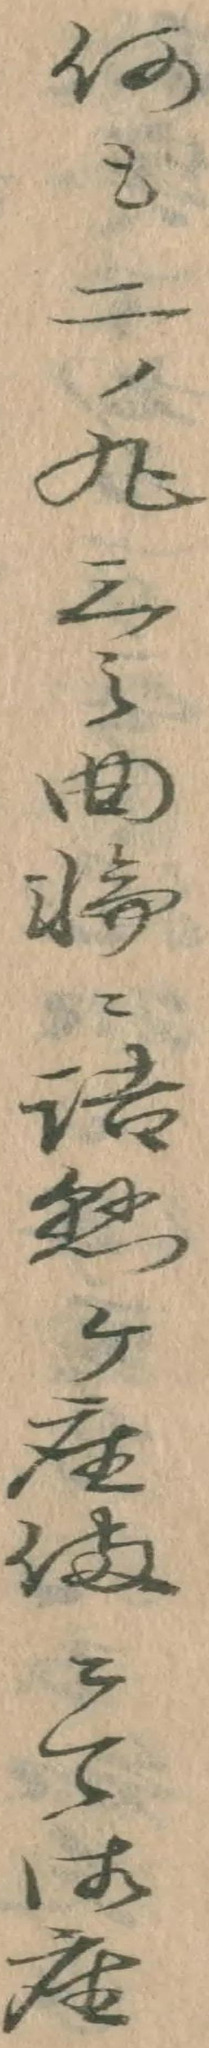何も二之丸三之曲輪に詰懸け座備にて御座
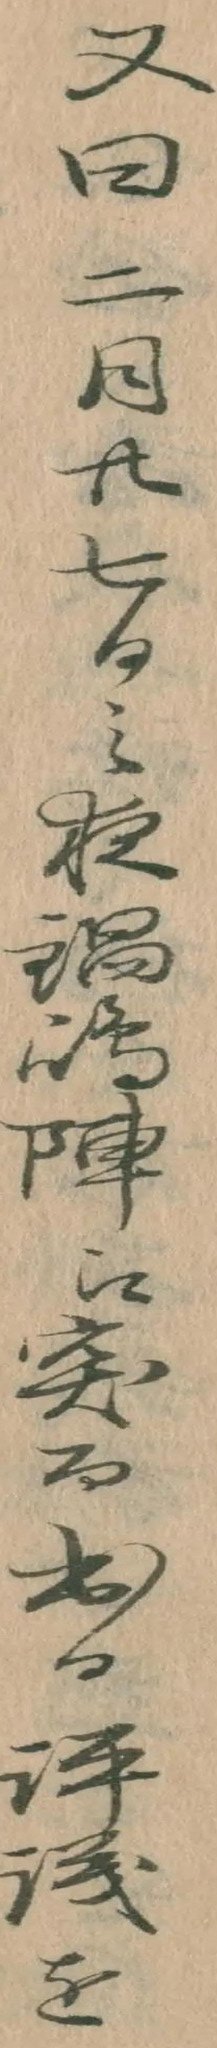又曰二月廿七日之夜鍋島陣江突而出る評議を
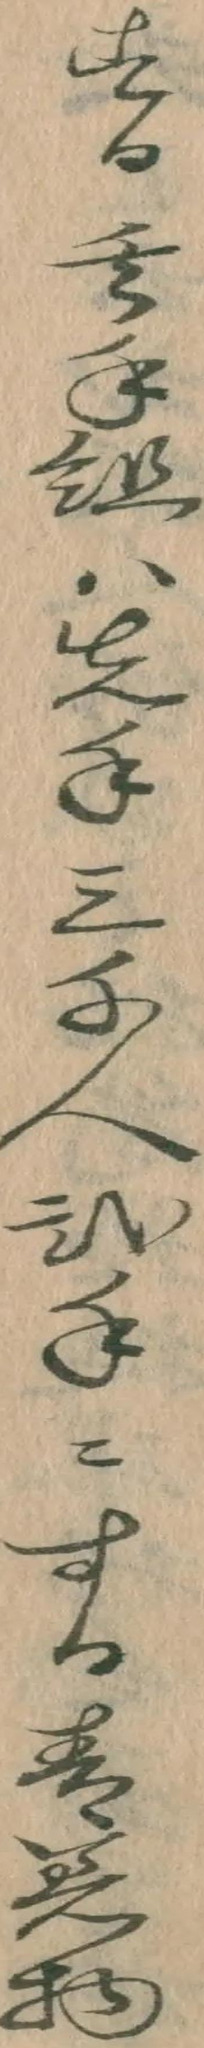春る其手組は先手三千人弐手にする青着物
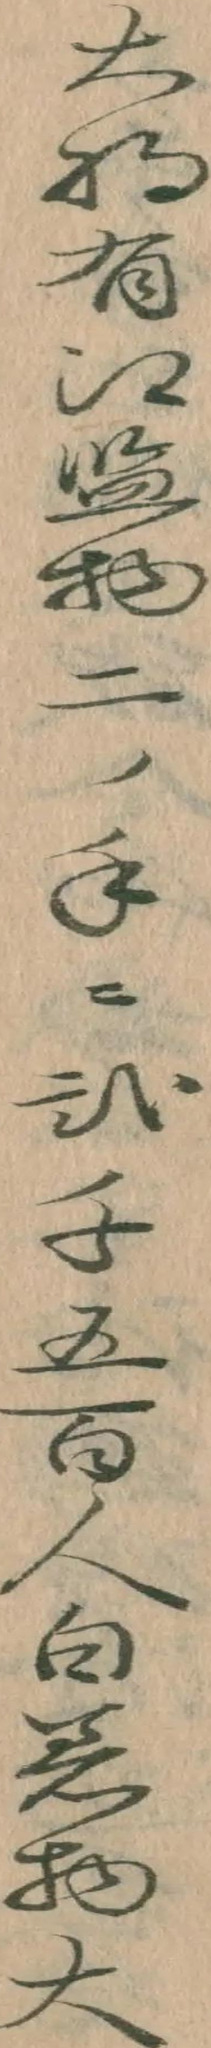大将有江監物二之手に弐千五百人白着物大
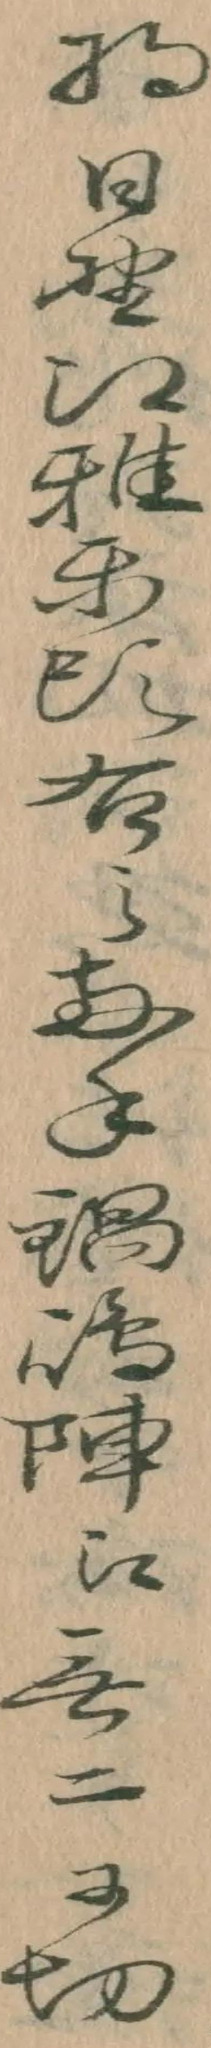将日野江雅楽頭右之両手鍋島陣江無二尓切
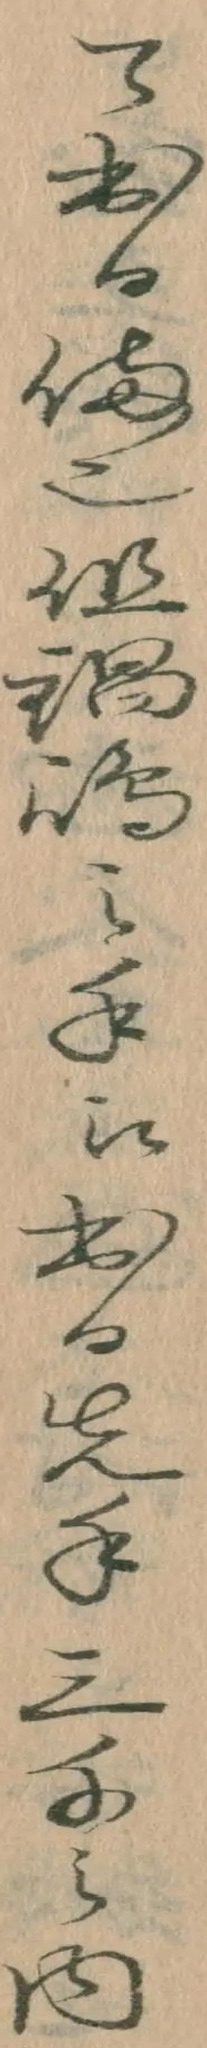て出る備也但鍋島之手江出る先手三千之内
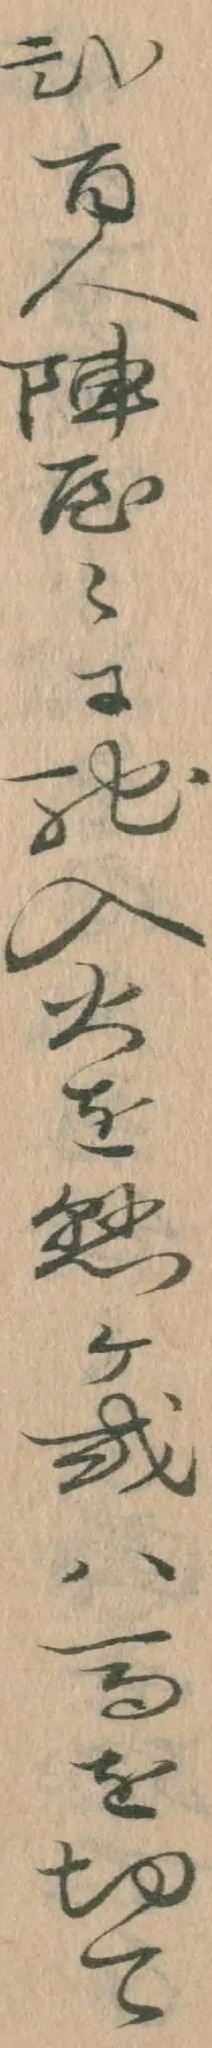弐百人陣屋〱尓馳入火を懸け或は馬を切て
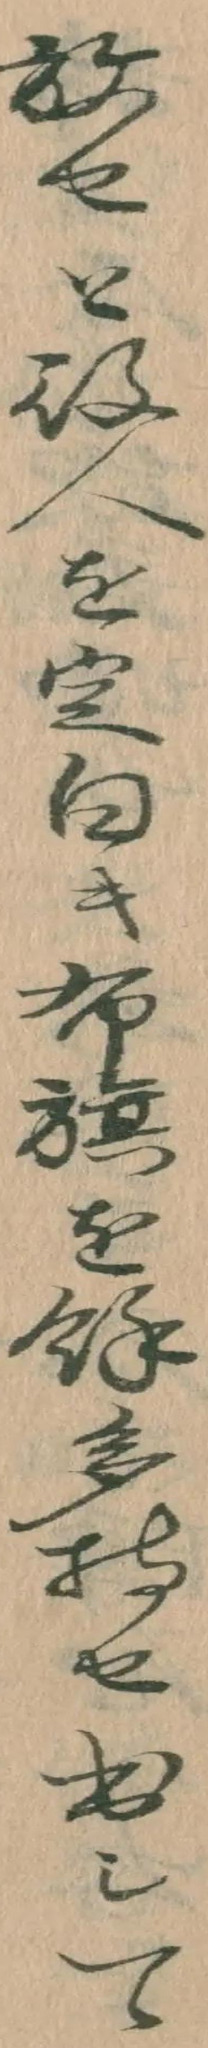放せと役人を定白き布旗を余多持せ出して
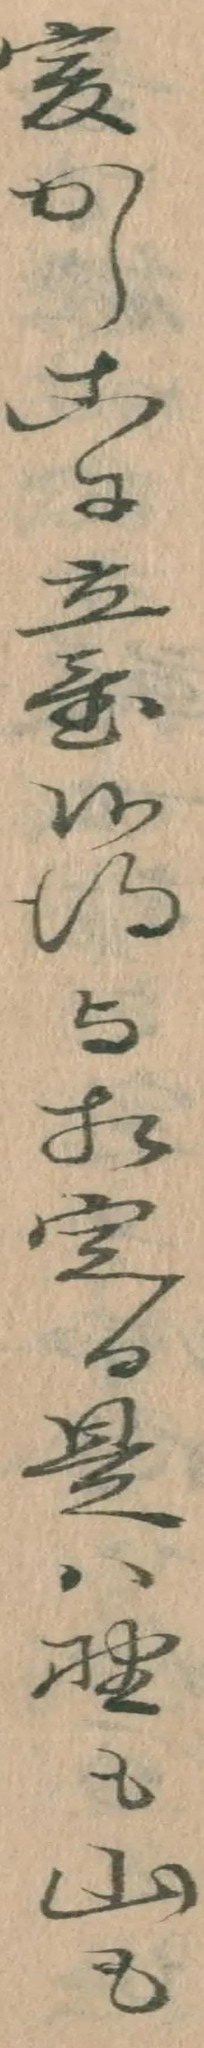爰かし古尓立置候得与相定る是は野も山も
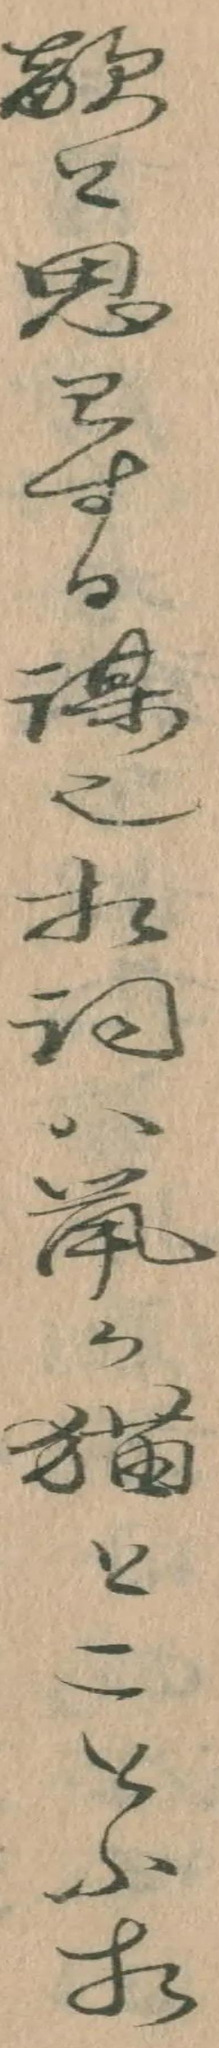敵と思已する謀也相詞は鼠か猫とことふ相
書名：切支丹御退治記 49巻. [7]
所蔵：国立国会図書館 National Diet Library, JAPAN
